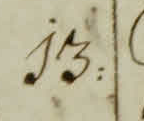13:
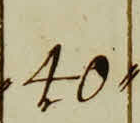40
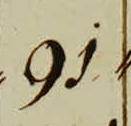91
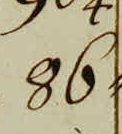86
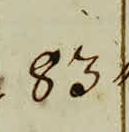83
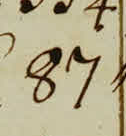87
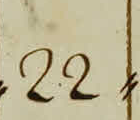22
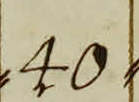40
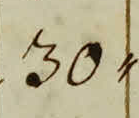30
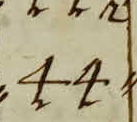44
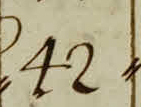42
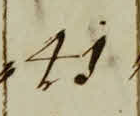41
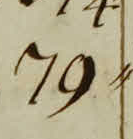79
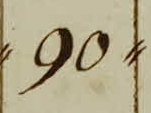90
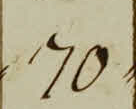70
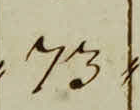73
